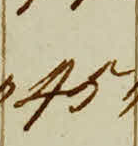45
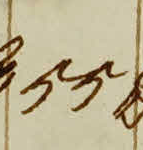55
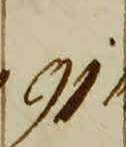91
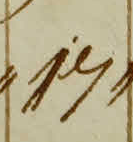17
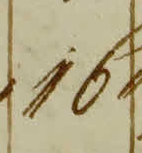16
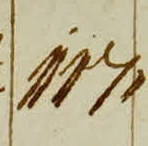117
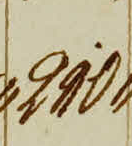280
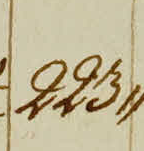223
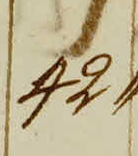42
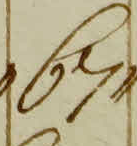67
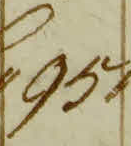95
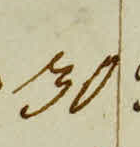30
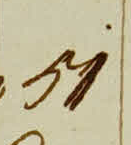51
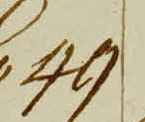49
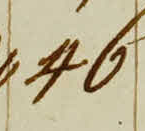46
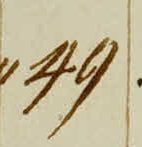49
